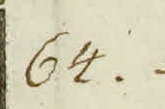64.
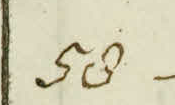58
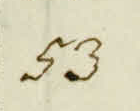53
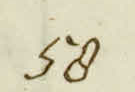58
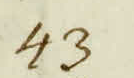43
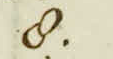8.
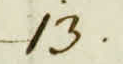13
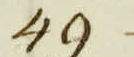49
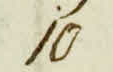10
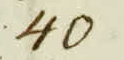40
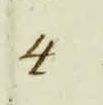4
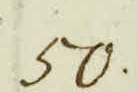50
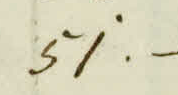51.
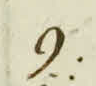9
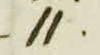11
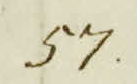57
